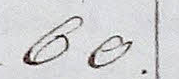60.
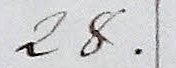28.
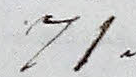71
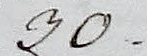30
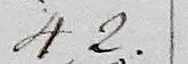42.
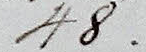48
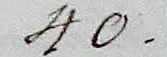40
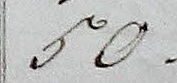50
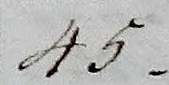45
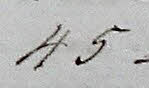45
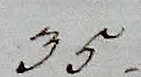35
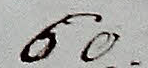60
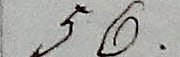56
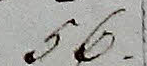56
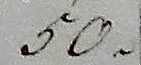50
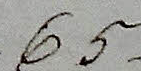65
